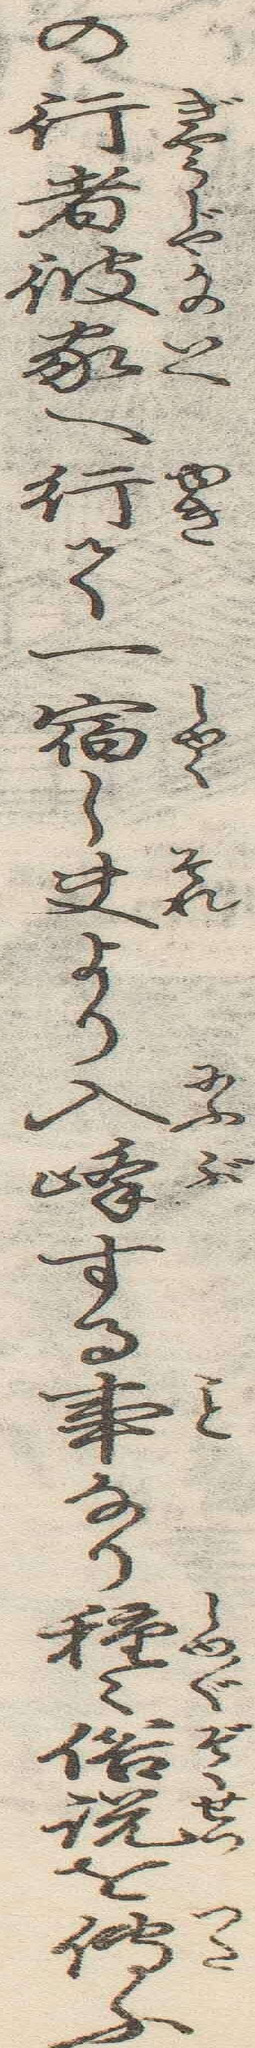の行者彼家へ行て一宿し夫より入峰する事なり種〻俗説を傳ふ
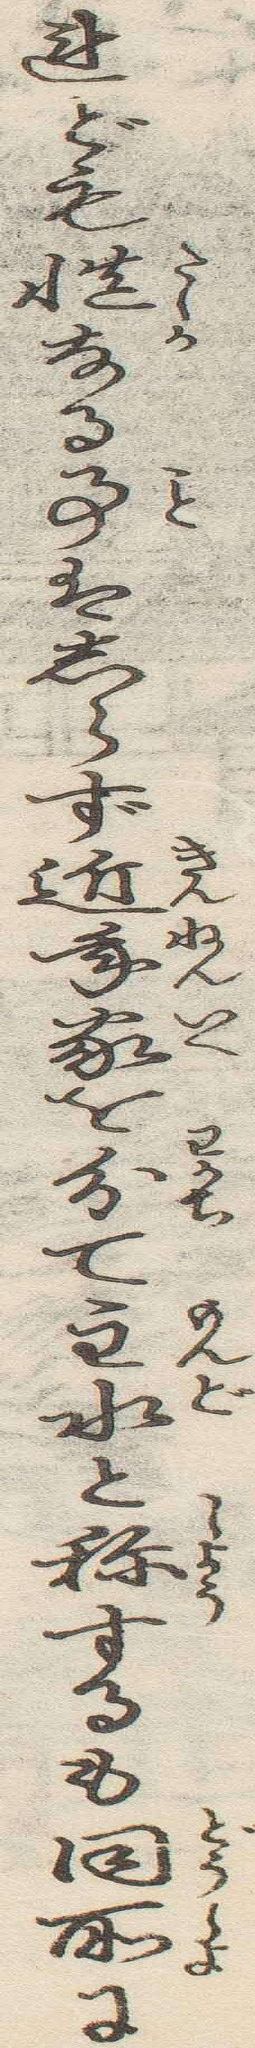れども慥なる事はしらず近年家を分て主水と称するも同所に
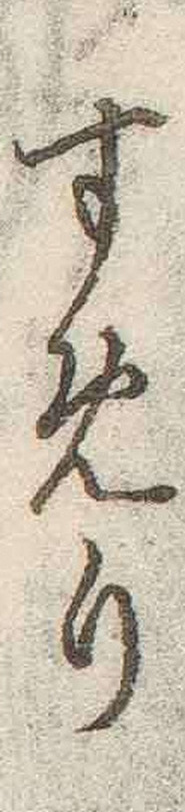すめり
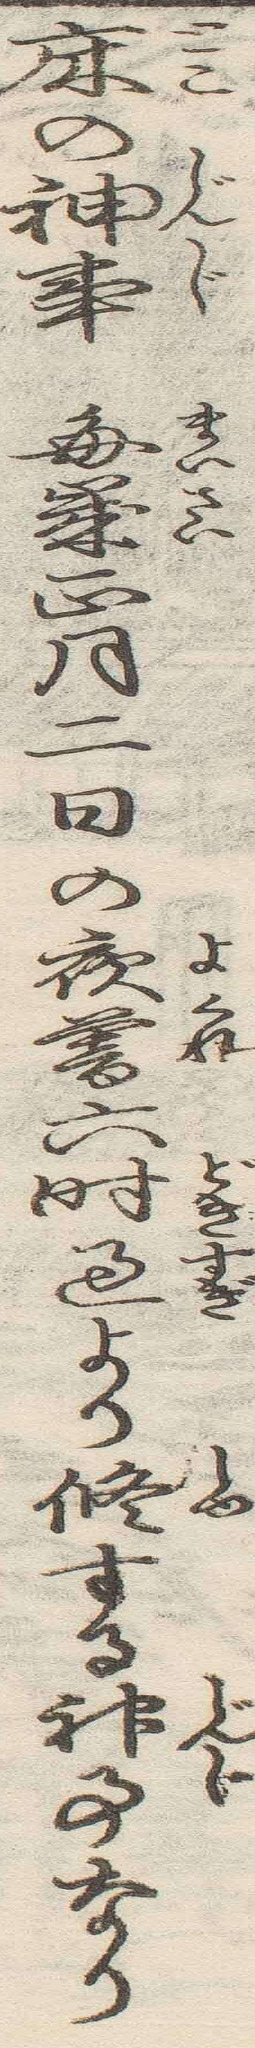床の神事毎歳正月二日の夜暮六时過より修する神事なり
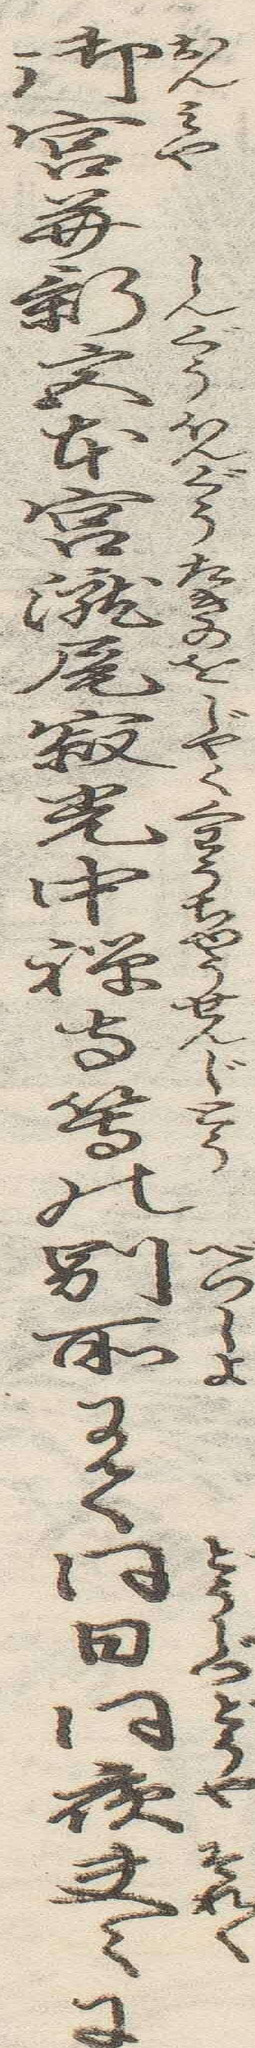御宮并新宮本宮瀧尾寂光中禅寺等の別所にて同日同夜夫〻に
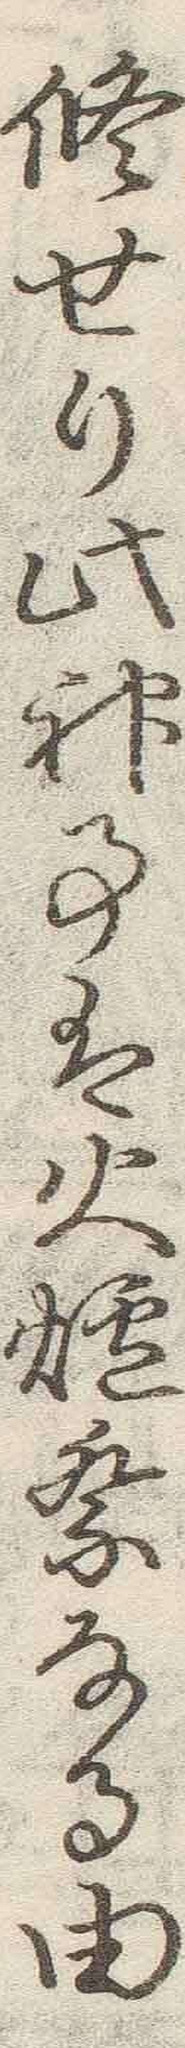修せり此神事は火爐祭なる由
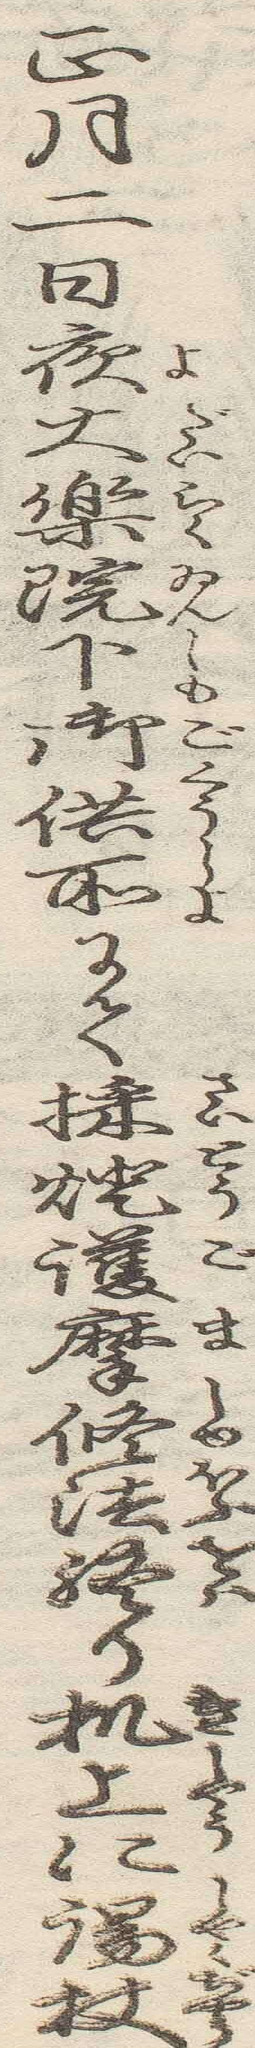正月二日夜大楽院下御供所にて採燈護摩修法終り机上に錫杖
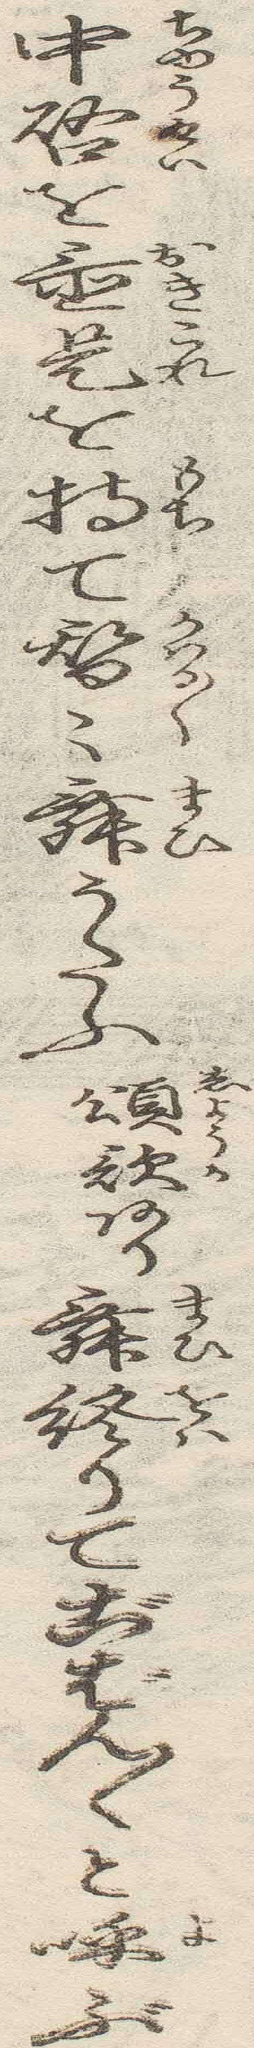中啓を置是を持て替〻舞うたふ頌歌あり舞終りてごばん〳〵と呼ぶ
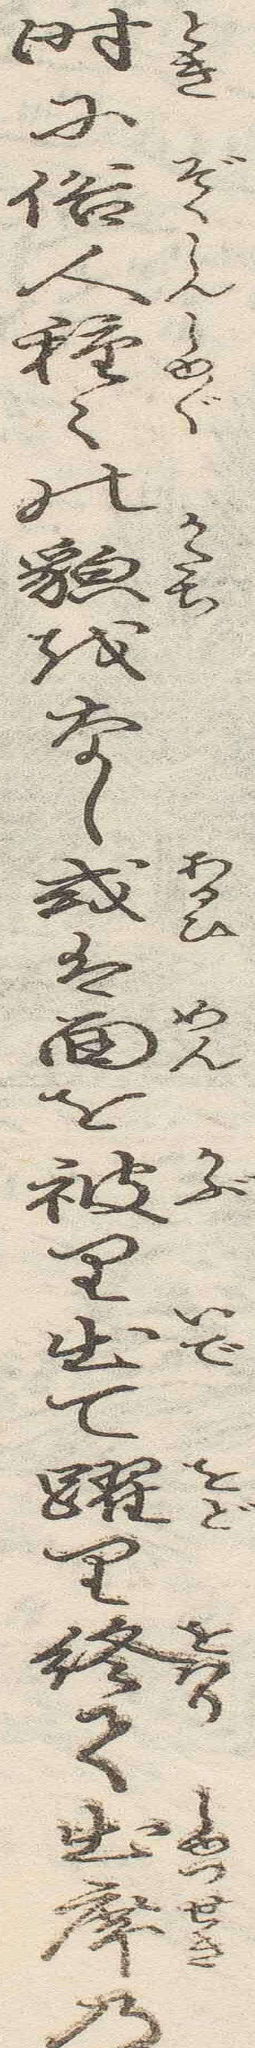时に俗人種〻の貌をなし或は面を被り出て躍り終て出席の
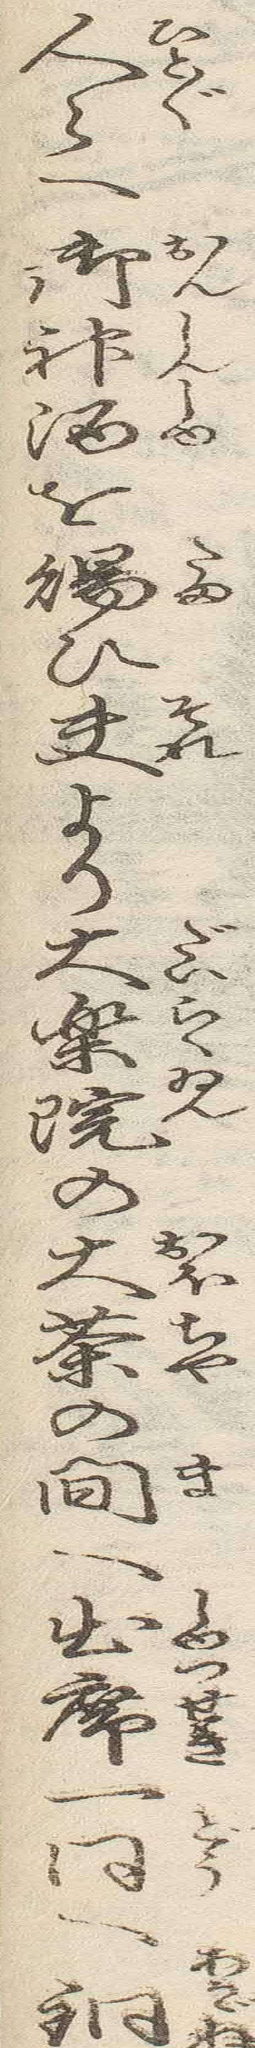人〻へ御神酒を賜ひ夫より大楽院の大茶の間へ出席一同へ銅
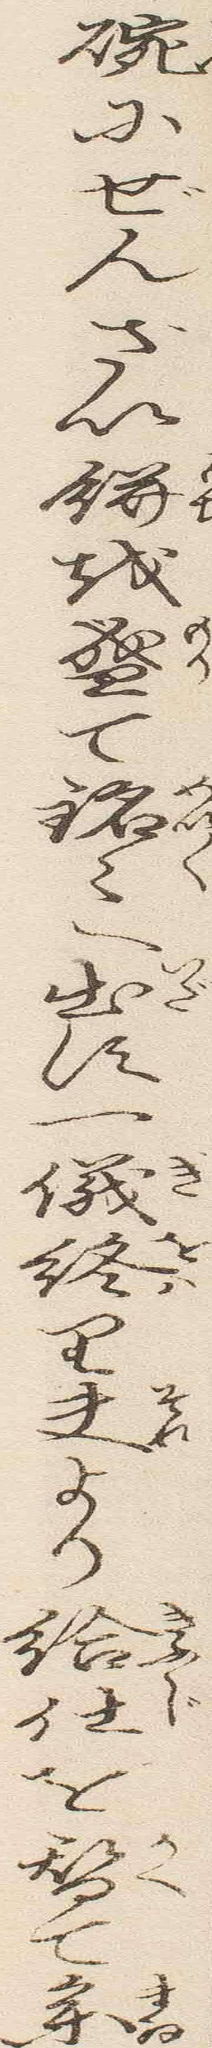碗にぜんざい餅を盛て銘〻へ出す一儀終り夫より給仕を替て参
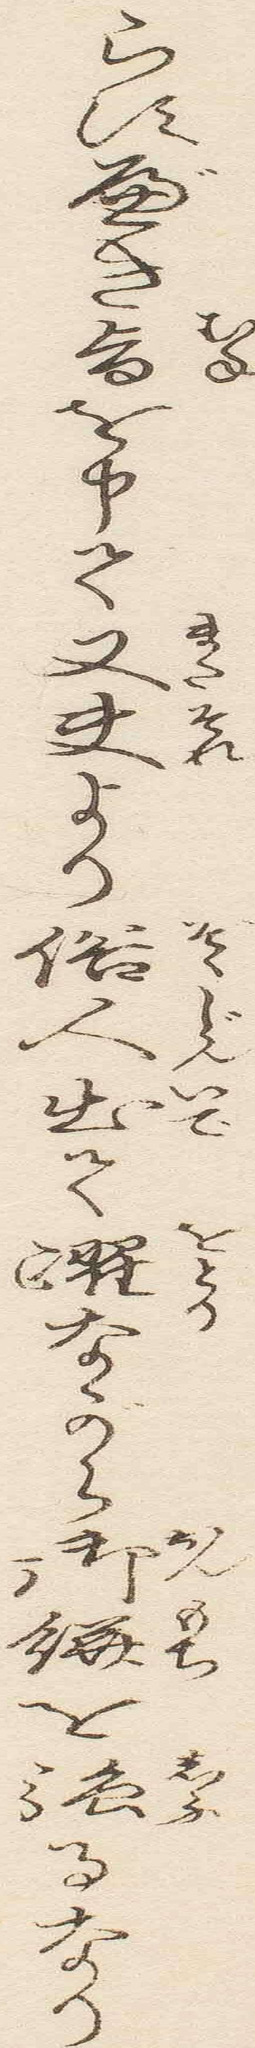らすべき㫖を申て又夫より俗人出て躍ながら御餅を強るなり
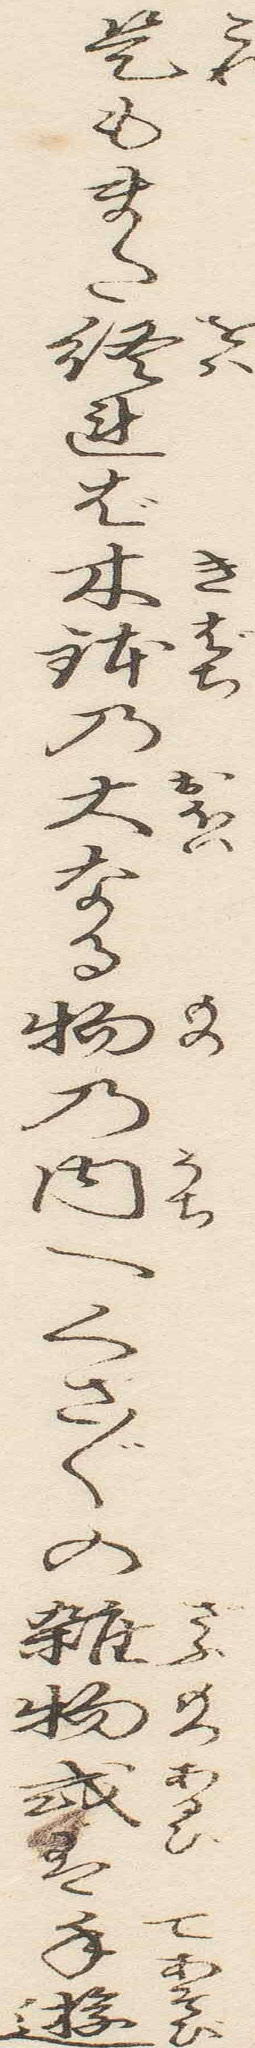是もまた終れば木鉢の大なる物の内へくさ〳〵の雑物或は手逰
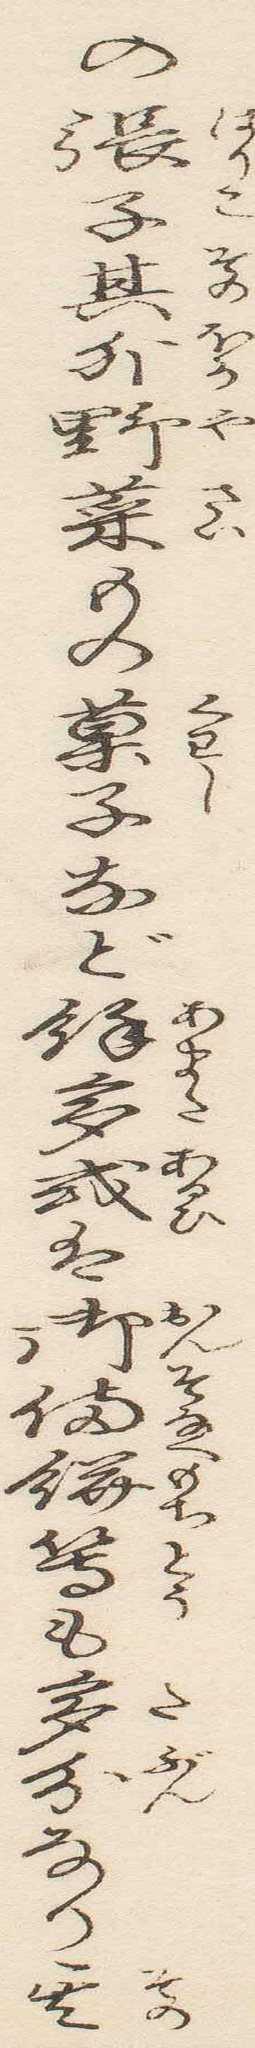の張子其外野菜もの菓子など餘多或は御備餅等も多分なり其
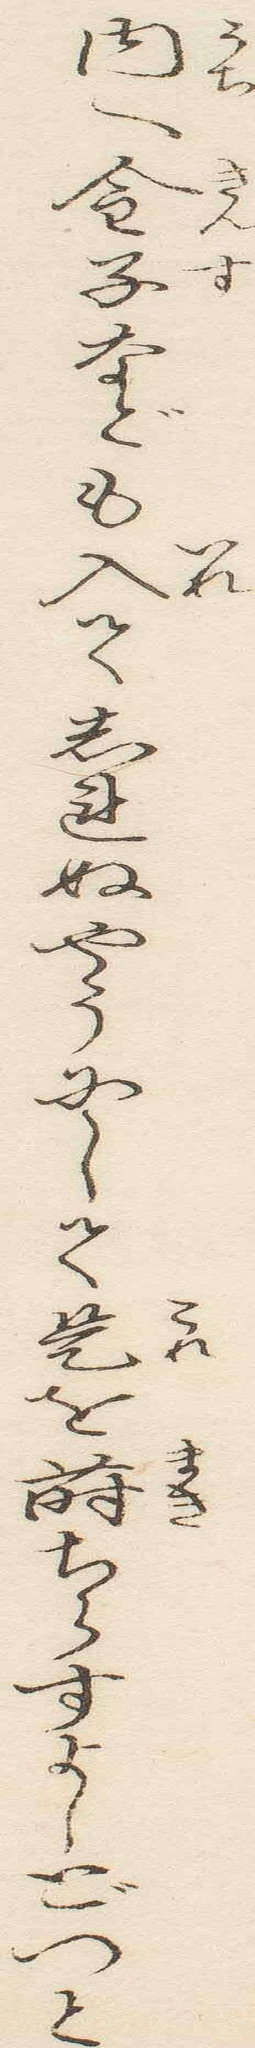内へ金子なども入てしれぬやうにして是を蒔ちらすよしどつと
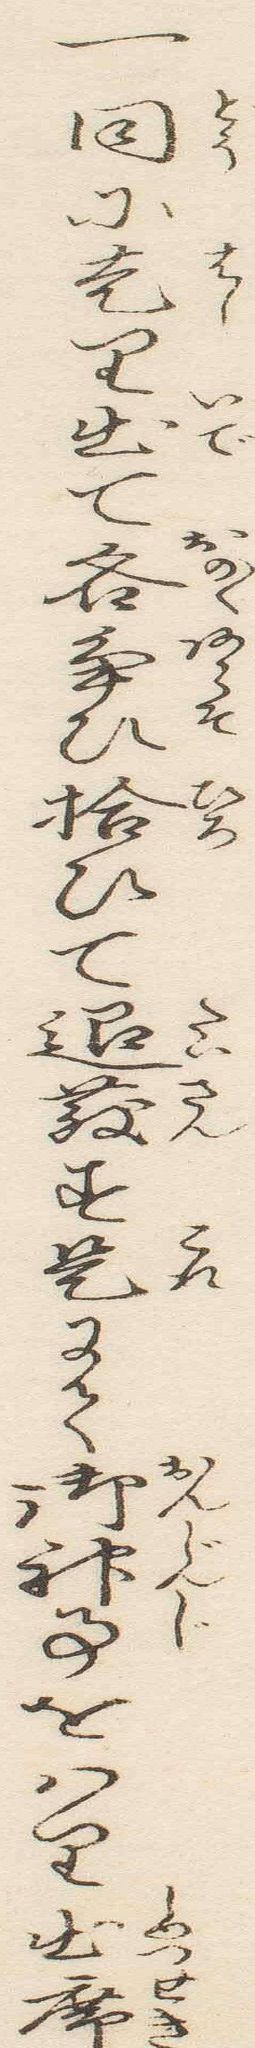一同に走り出て各争ひ拾ひて退散す是にて御神事をはり出席
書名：日光山志
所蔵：東京学芸大学附属図書館 国文学研究資料館
